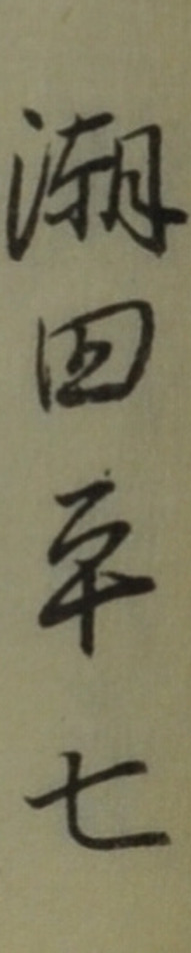潮田平七
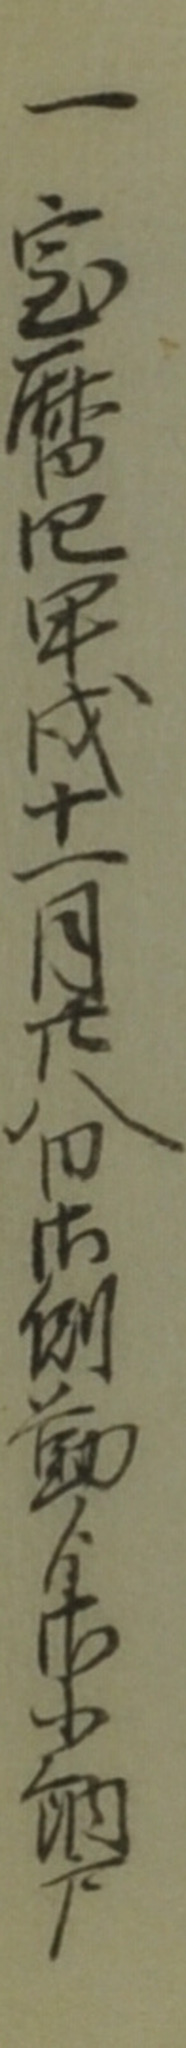一宝暦四甲戌十一月廿八日御側勤ゟ御小納戸
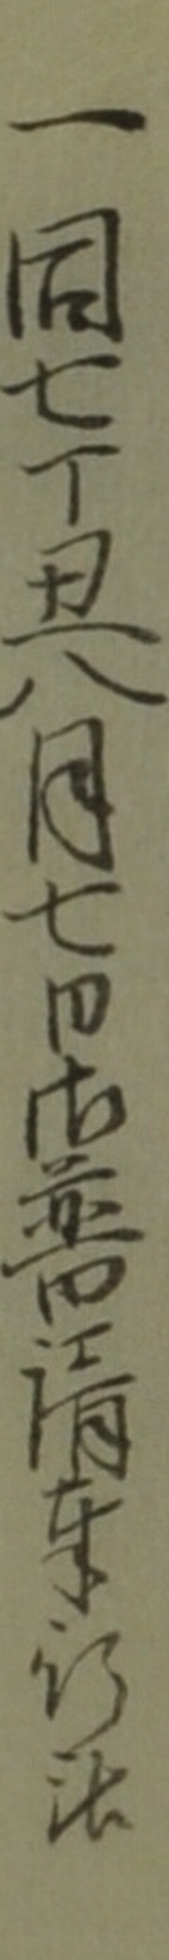一同七丁丑八月七日御普請奉行被
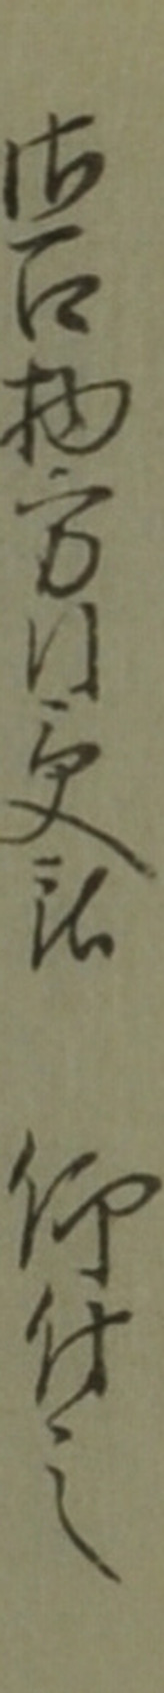御召物方引受被仰付之
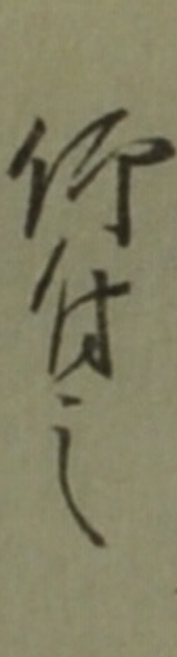仰付之
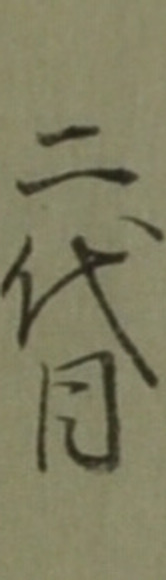二代目
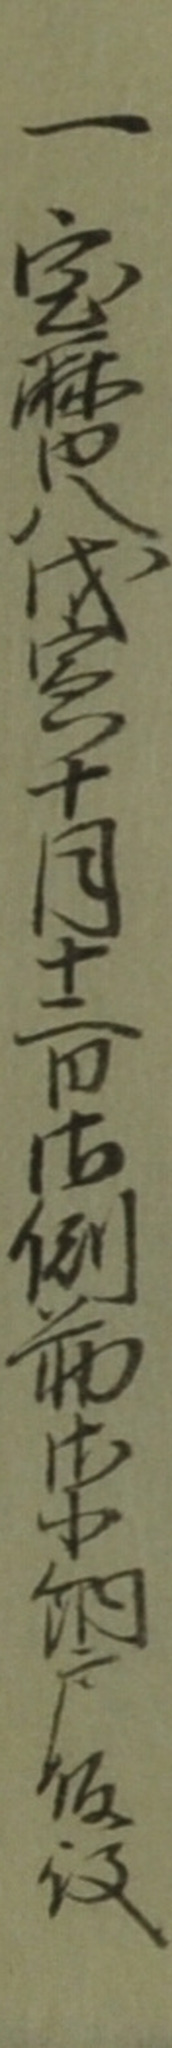一宝暦八戊寅十月十二日御側勤御小納戸仮役
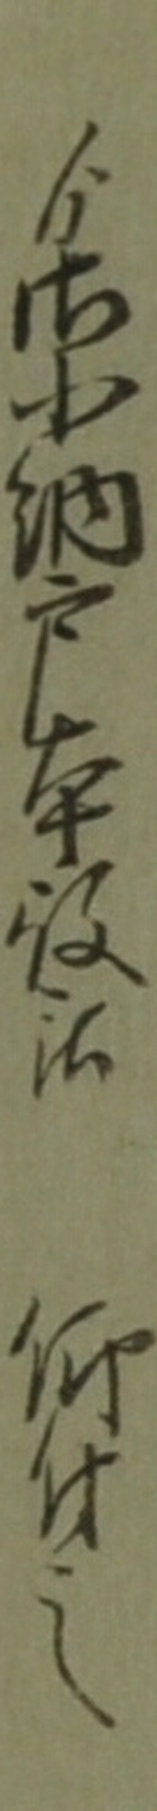ゟ御小納戸本役被仰付之
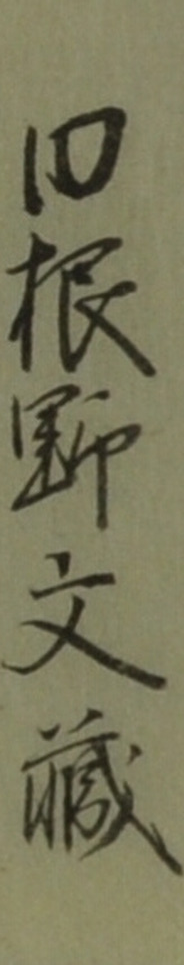日根野文蔵
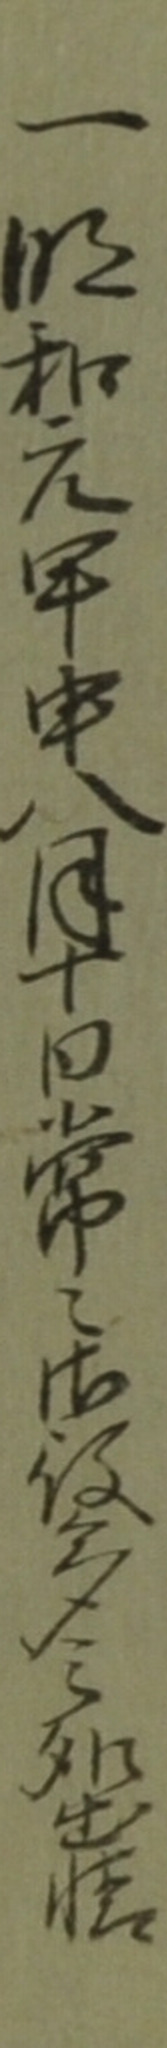一明和元甲申八月十日常々御役多之処出精
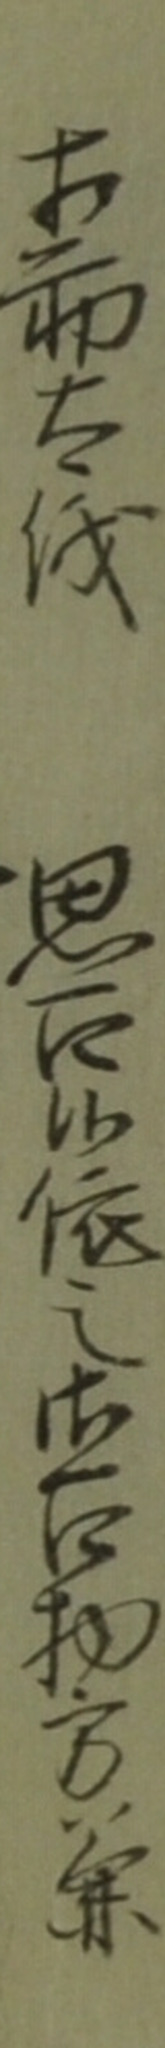相勤太儀思召候依之御召物方兼
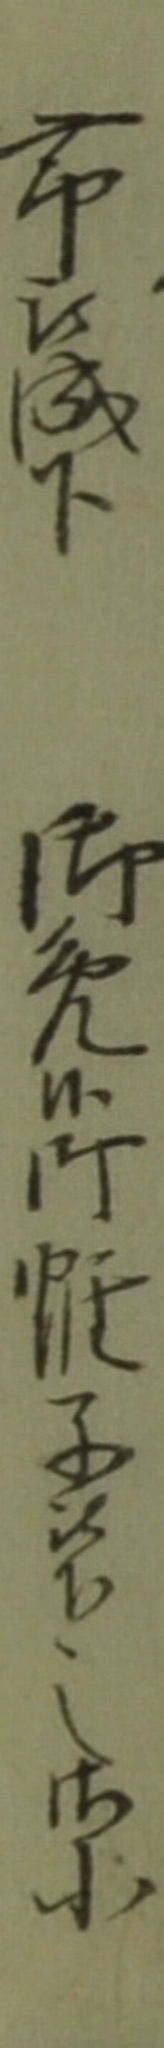帯被成下御免候御帷子被下之御小
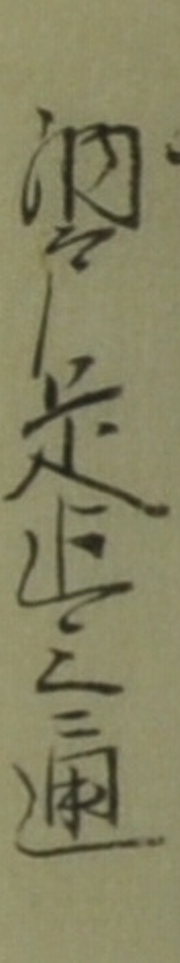納戸是迄之通

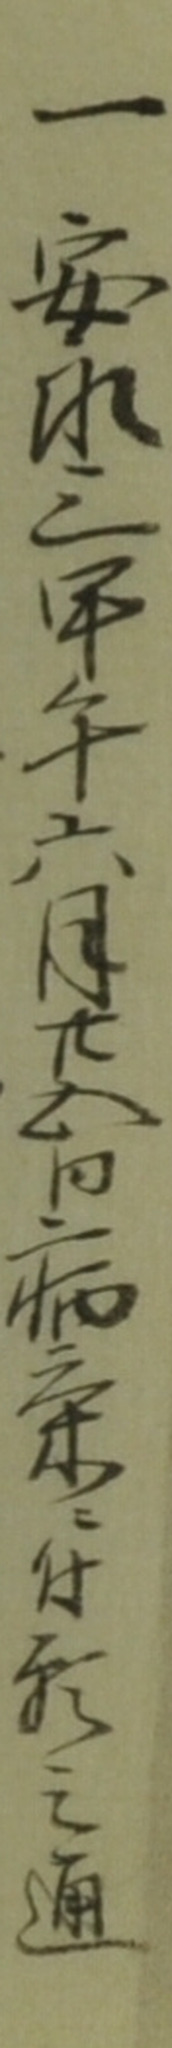一安永三甲午六月廿五日病気ニ付願之通
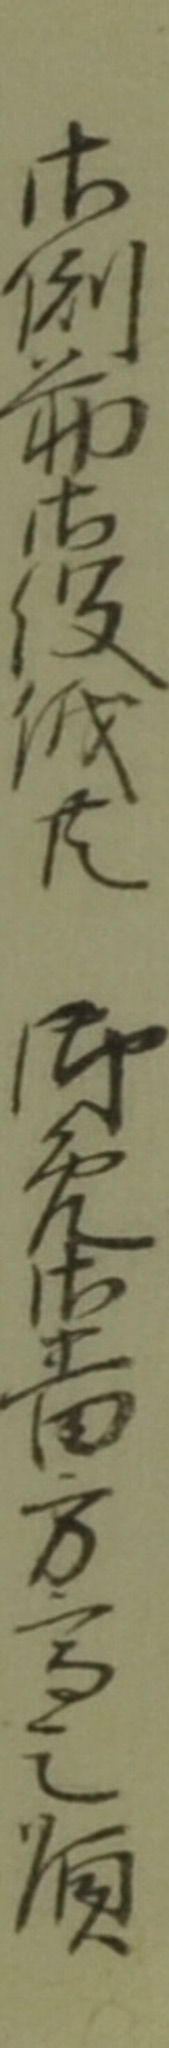御側勤御役儀共御免御番方高之順
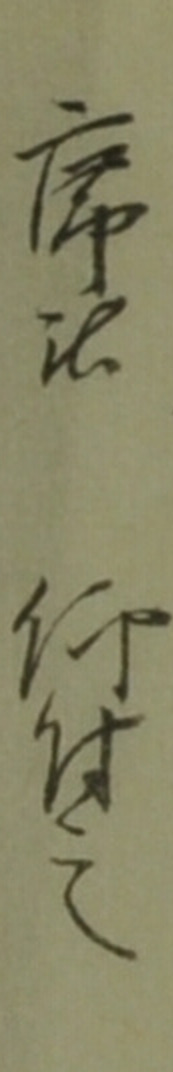席被仰付之
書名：諸御役代々録（四）
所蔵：伊那市立高遠町図書館・合同会社AMANE
